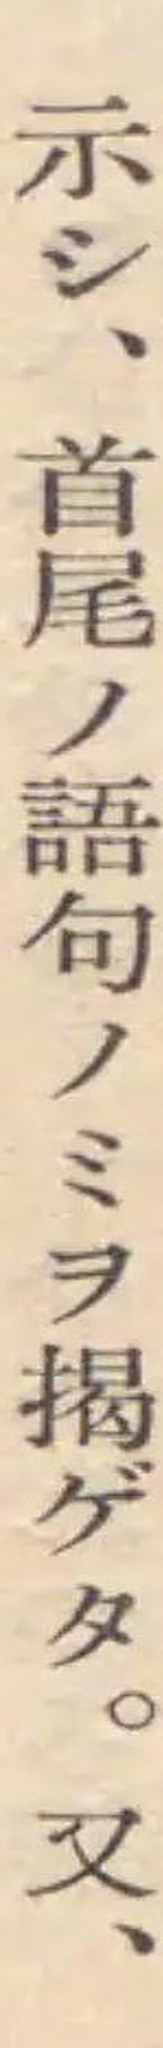示シ、首尾ノ語句ノミヲ掲ゲタ。又、
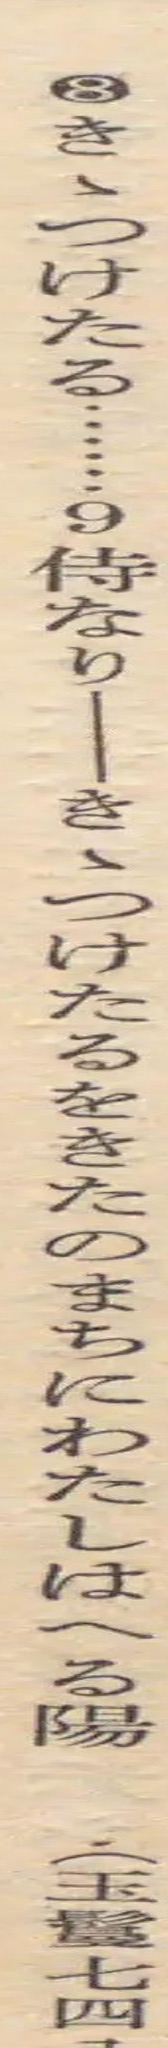➑きゝつけたる……９侍なり──きゝつけたるをきたのまちにわたしはへる陽(玉鬘七四八頁)
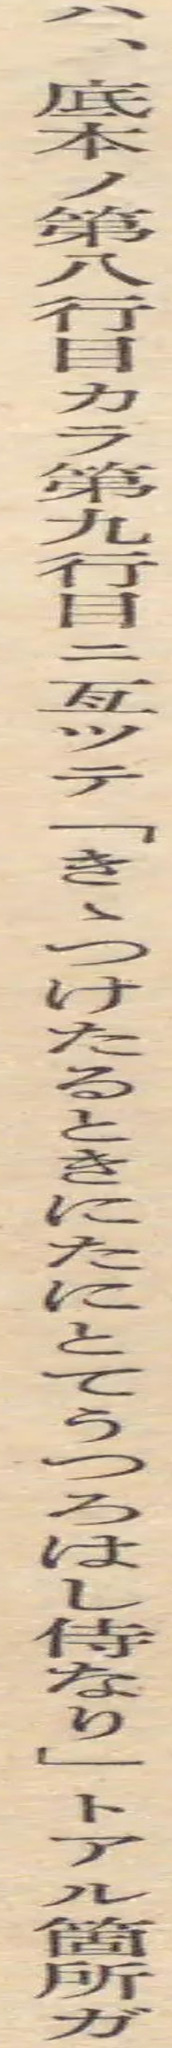ハ、底本ノ第八行目カラ第九行目ニ亘ツテ「きゝつけたるときにたにとてうつろはし侍なり」トアル箇所ガ、
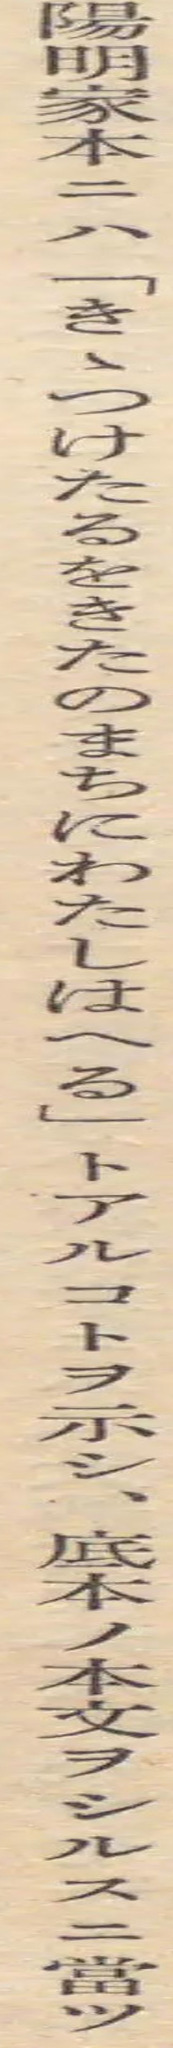陽明家本ニハ「きゝつけたるをきたのまちにわたしはへる」トアルコトヲ示シ、底本ノ本文ヲシルスニ当ツ
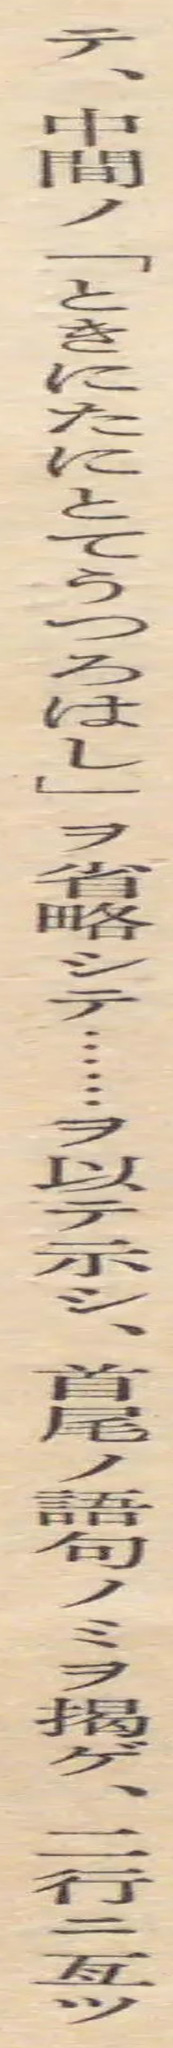テ、中間ノ「ときにたにとてうつろはし」ヲ省略シテ……ヲ似テ示シ、首尾ノ語句ノミヲ掲ゲ、二行ニ亘ツ
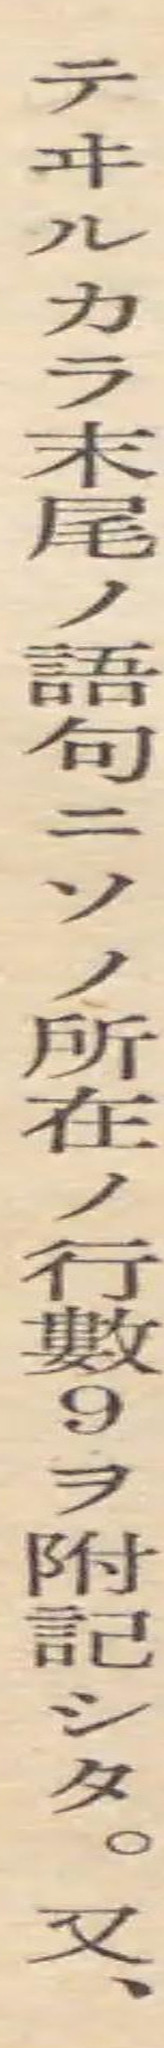テヰルカラ末尾ノ語句ニソノ所在ノ行数９ヲ附記シタ。又、
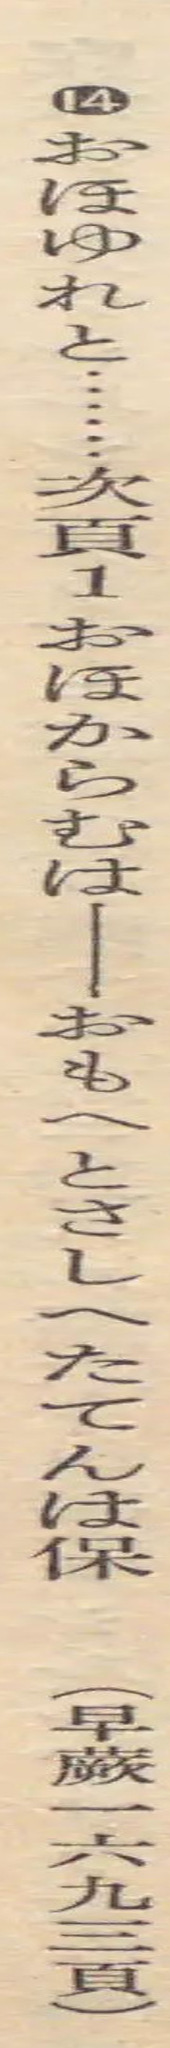⓮おほれゆれと……次頁１おほからむは──おもへとさしへたてんは保(早蕨一六九三頁)
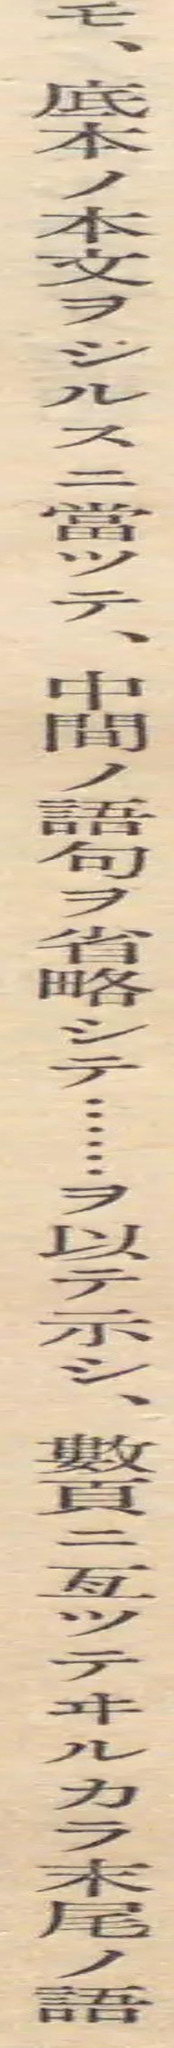モ、底本ノ本文ヲシルスニ当ツテ、中間ノ語句ヲ省略シテ……ヲ似テ示シ、数頁ニ亘ツテヰルカラ末尾ノ語
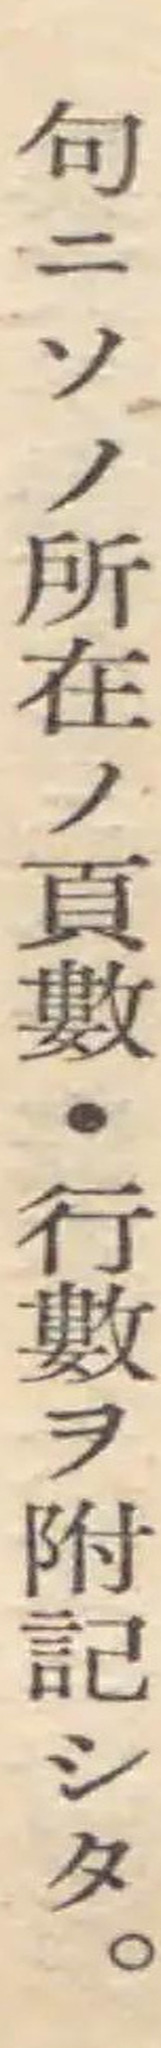句ニソノ所在ノ頁数・行数ヲ附記シタ。
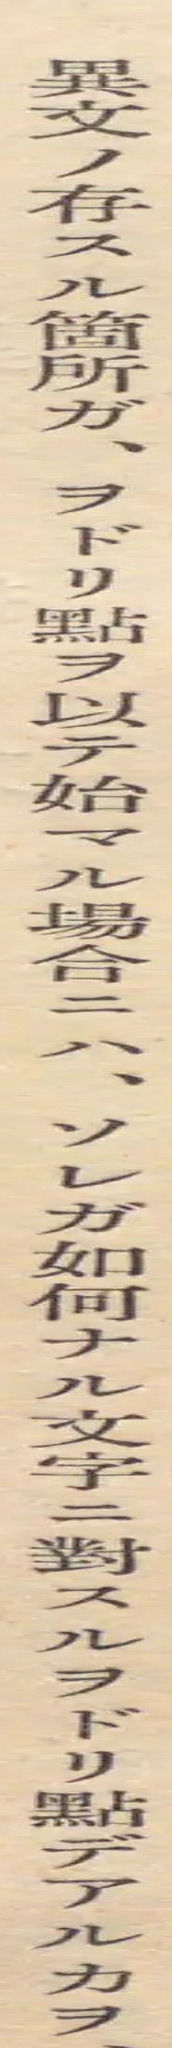一異文ノ存スル箇所ガ、ヲドリ点ヲ似テ始マル場合ニハ、ソレガ如何ナル文字ニ対スルヲドリ点デアルカヲ、
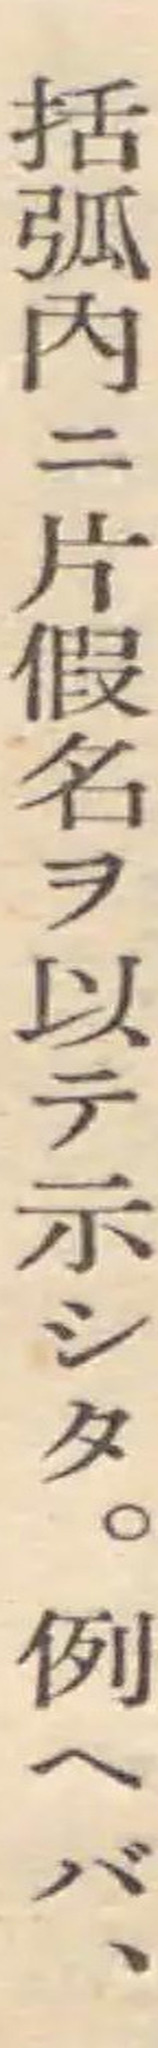括弧内ニ片仮名ヲ似テ示シタ。例ヘバ、
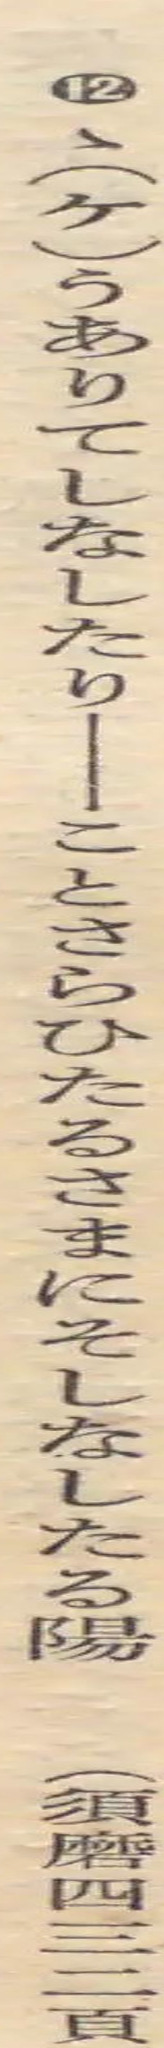⓬ゝ(ケ)うありてしなしたり──ことさらひたるさまにそしなしたる陽(須磨四二頁)
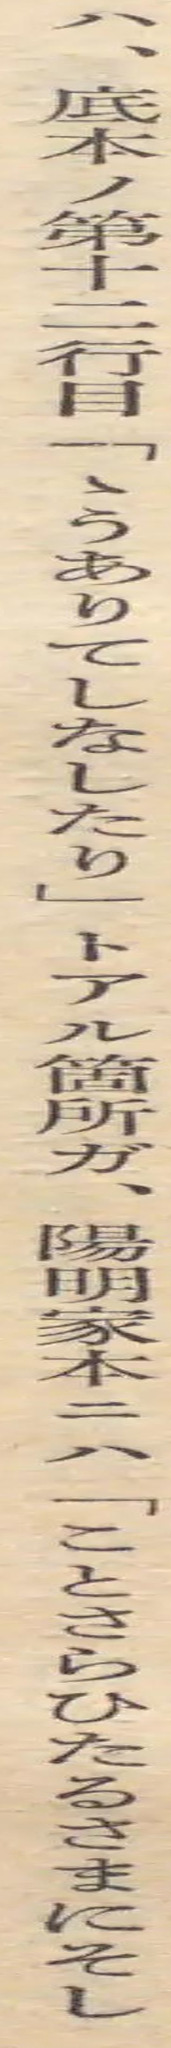ハ、底本ノ第十二行目「ゝうありてしなしたり」トアル箇所ガ、陽明家本ニハ「ことさらひたるさまにそし
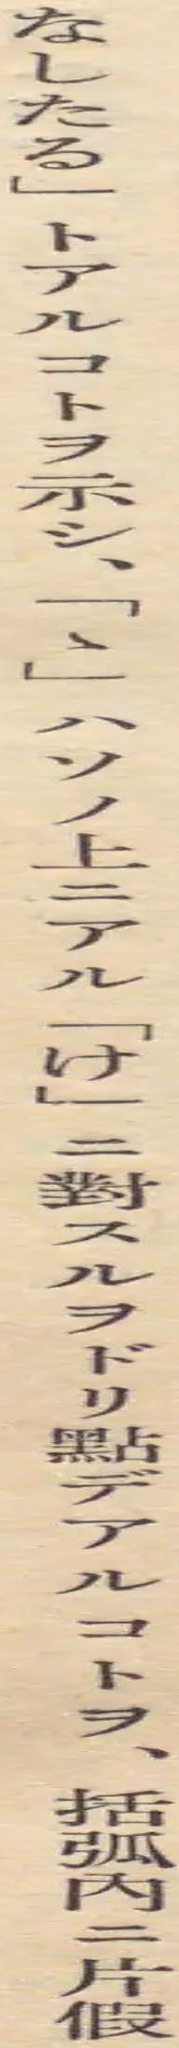なしたる」トアルコトヲ示シ、「ゝ」ハソノ上ニアル「け」ニ対スルヲドリ点デアルコトヲ、括弧内ニ片仮
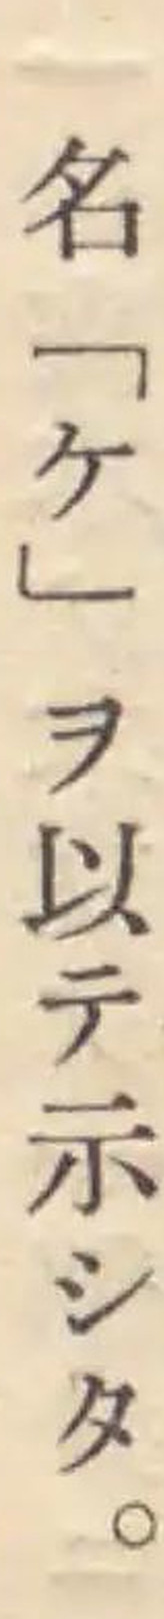名「ケ」ヲ似テ示シタ。
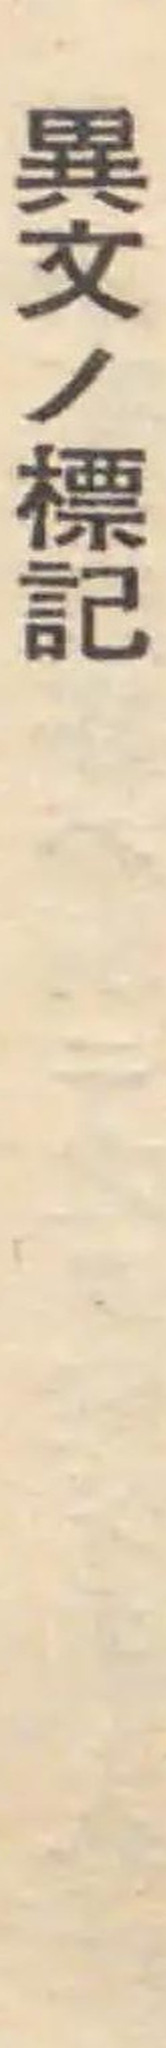異文ノ標記
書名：校異源氏物語.
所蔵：国立国会図書館 National Diet Library, JAPAN
